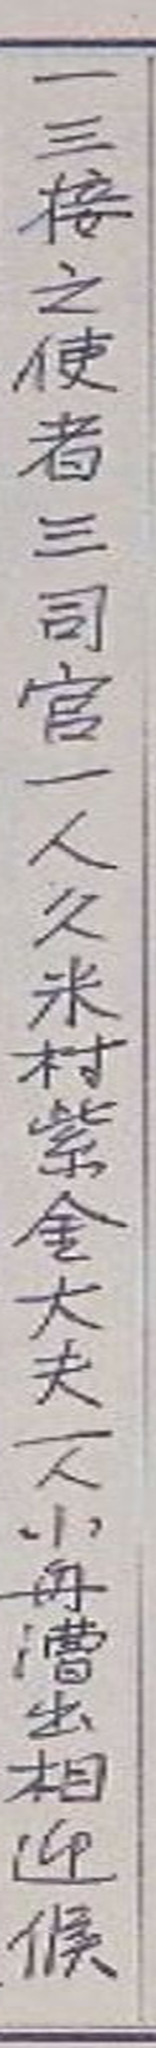一三接之使者三司官一人久米村紫金大夫一人小舟漕出相迎候
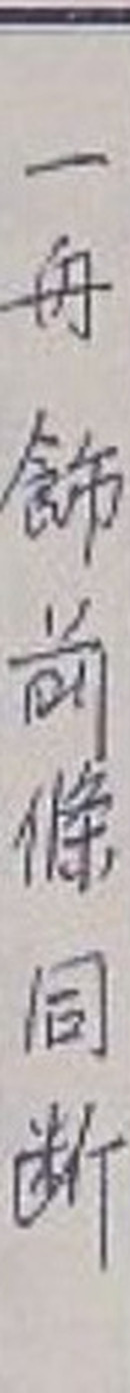一舟飾前条同断
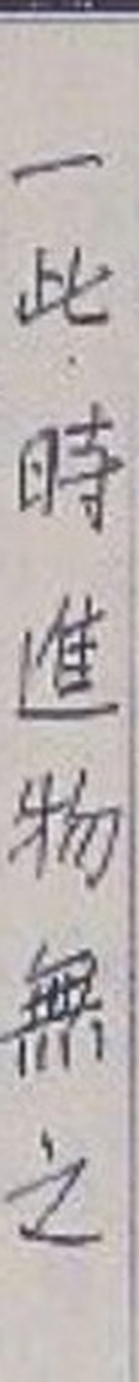一此時進物無之
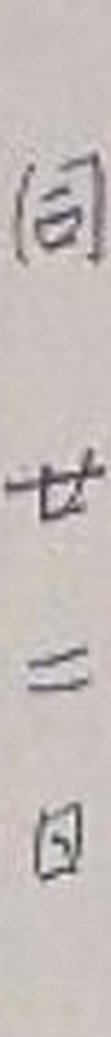同廿二日
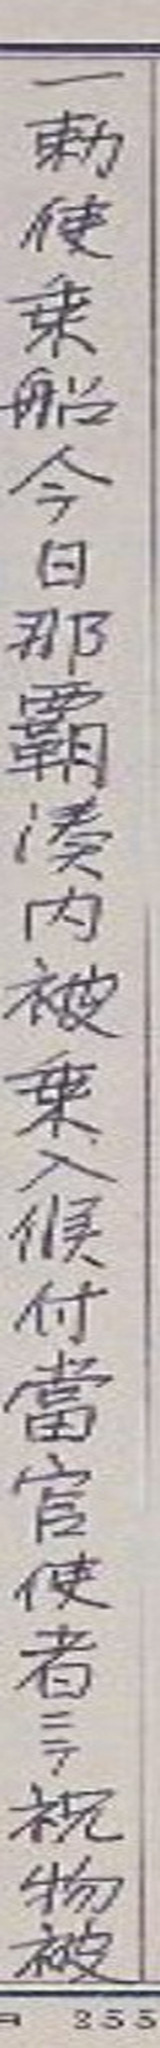一勅使乗船今日那覇湊内被乗入候付当官使者にて祝物被
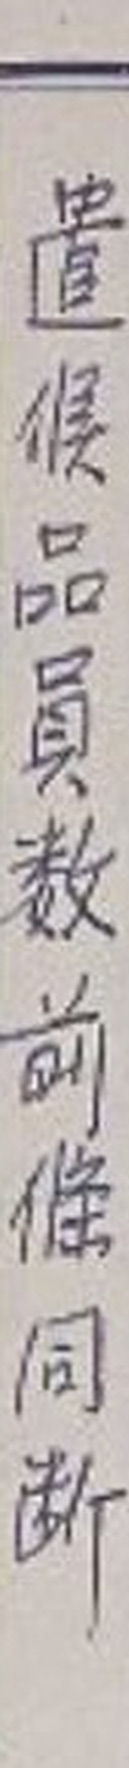遣候品員数前条同断
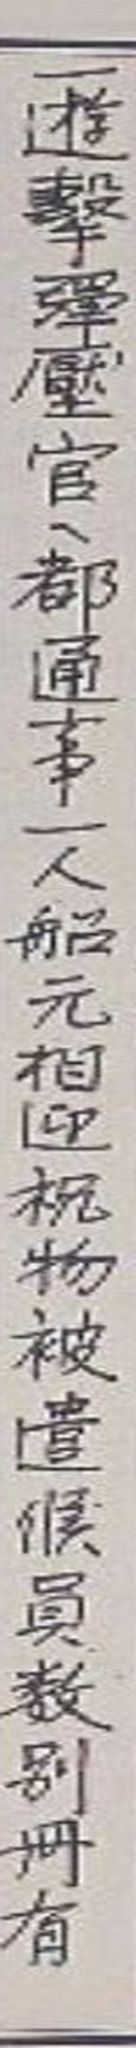一遊撃弾圧官へ都通事一人船元相迎祝物被遣候員数別冊有
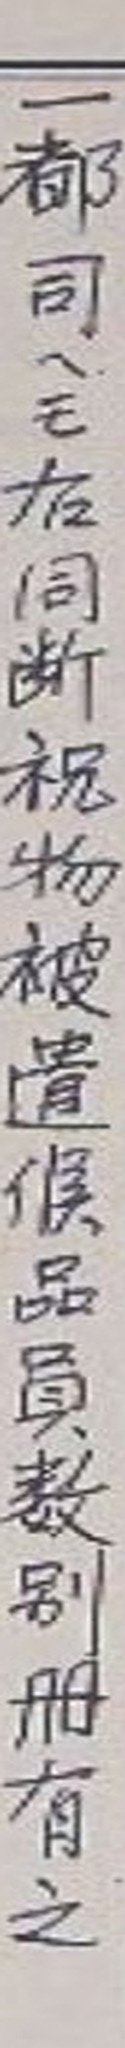一都司へも右同断祝物被遣候品員数別冊有之
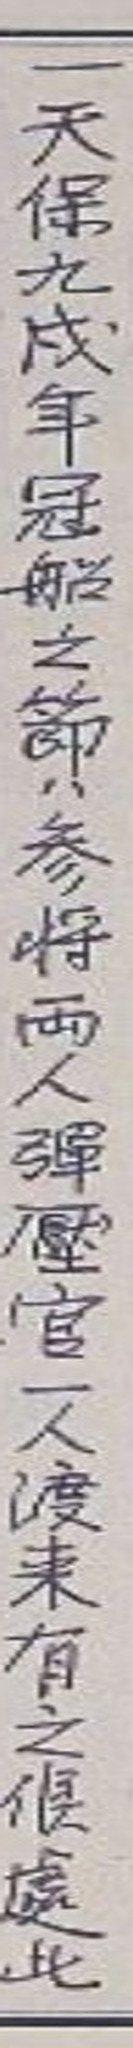一天保九戌年冠船之節は参将両人弾圧官一人渡来有之候処此
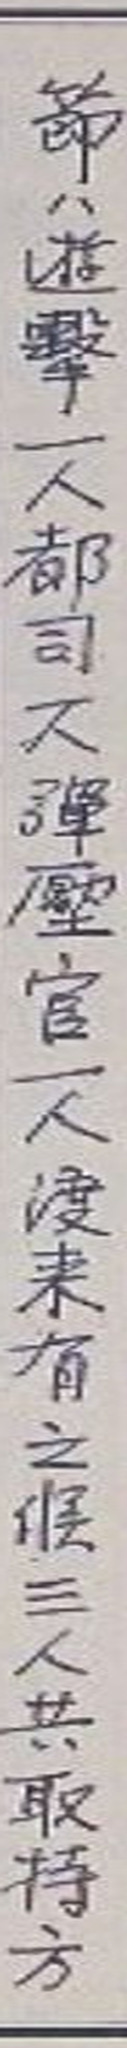節は遊撃一人都司一人弾圧官一人渡来有之候三人共取持方
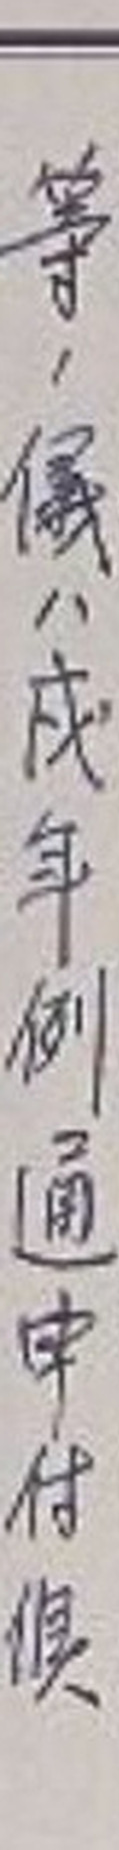等の儀は戌年例通申付候
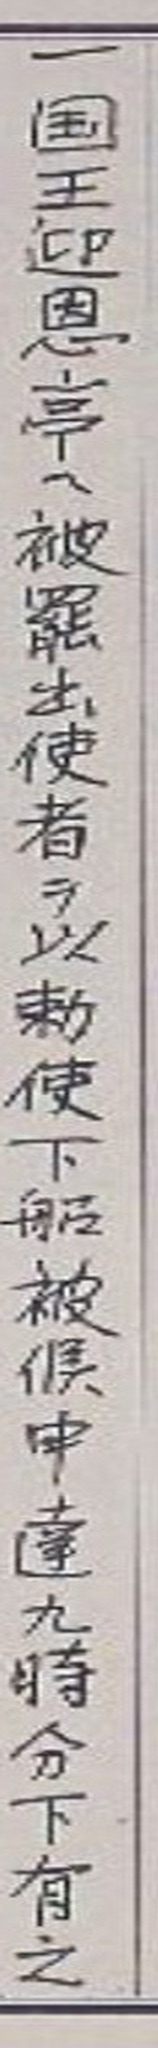一国王迎恩亭へ被罷出使者を以勅使下船被候申達九時分下有之
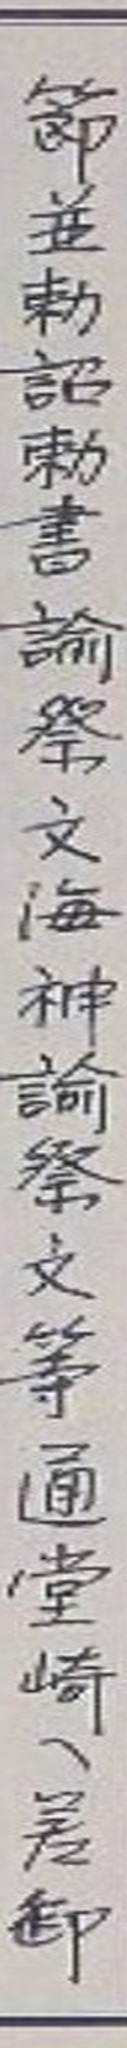節並勅詔勅書諭祭文海神諭祭文等通堂崎へ差卸
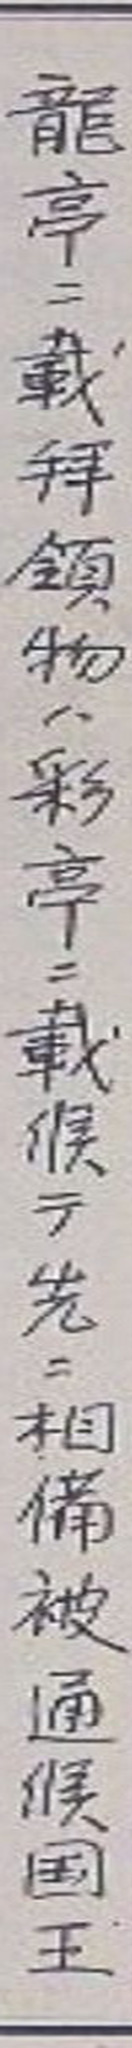龍亭に載拝領物は彩亭に載候て先に相備被通候国王
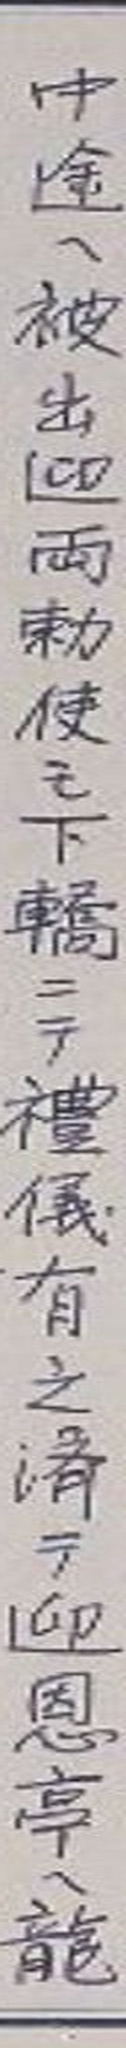中途へ被出迎両勅使も下轎にて礼儀有之済て迎恩亭へ龍
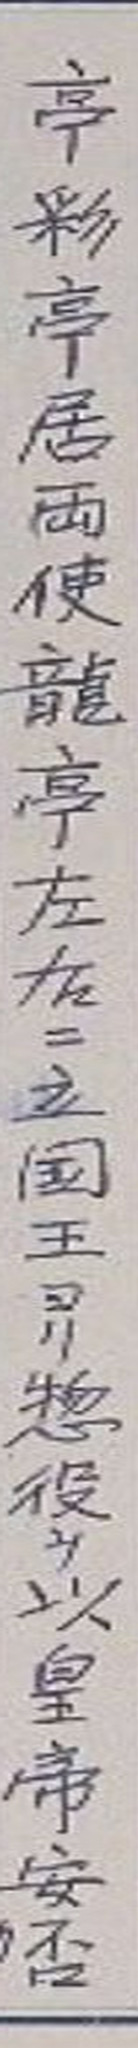亭彩亭居両使龍亭左右に立国王より惣役を以皇帝安否
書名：支那冊封使来琉諸記 下巻
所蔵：University of the Ryukyus Library
